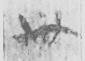卅
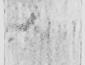六
